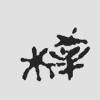{木㫃杲}
